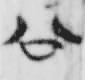公
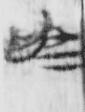爲
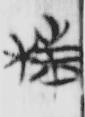株
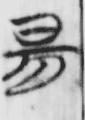昜（陽）
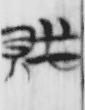貸
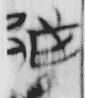○（越）
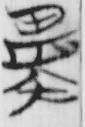異
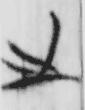之
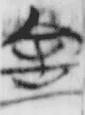金
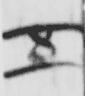五
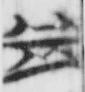益
